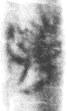○（陳）
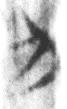方
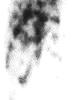内
